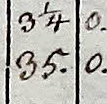35.
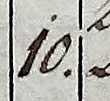10.
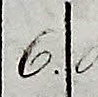6.
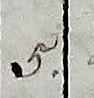5.
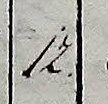12.
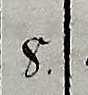8.
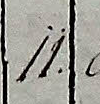11.
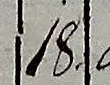18.
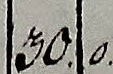30.
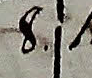8.
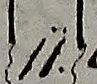11.
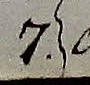7.
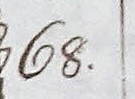68.
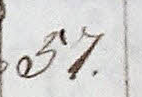57.
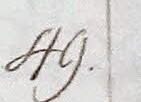49.
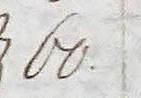60.
